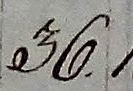36.
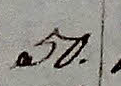50.
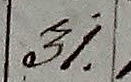31.
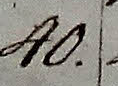40.
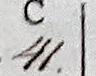41.
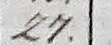27.
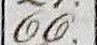66
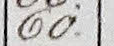60.
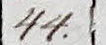44.
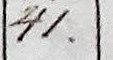41.
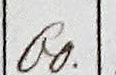60.
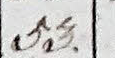53.
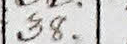38.
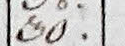30.
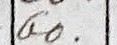60.
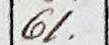61.
